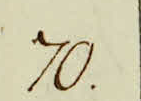70.
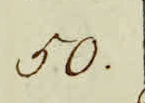50.
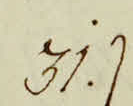31.
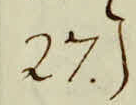27.
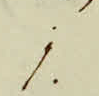1.
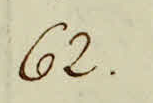62.
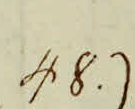48.
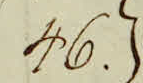46.
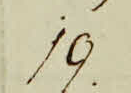19.
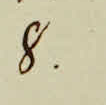8.
